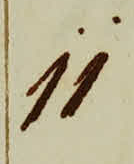11
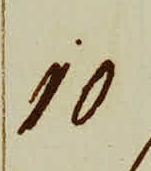10
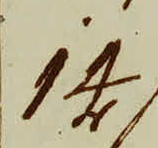14
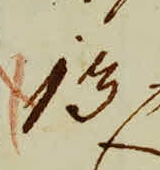13
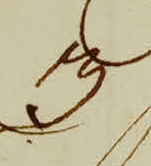3
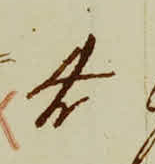4
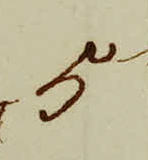5
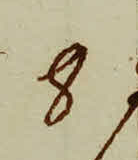8
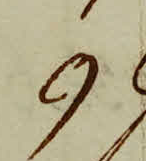9
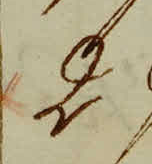2
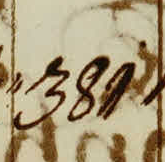381
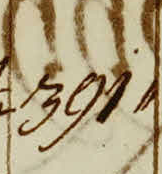391
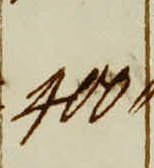400
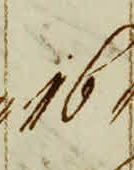16
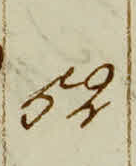52
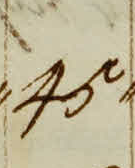45
